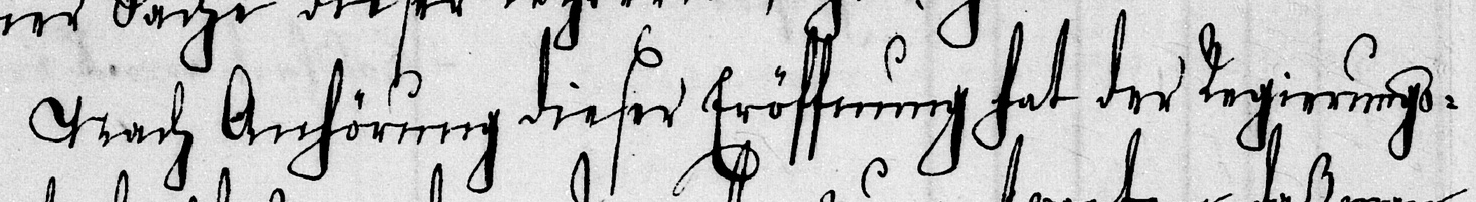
Nach Anhörung dieser Eröffnung hat der Regierungs¬
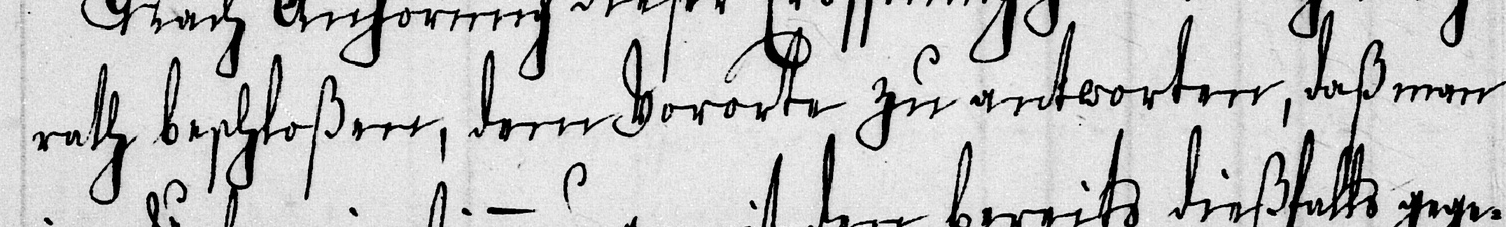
rath beschloßen, dem Vororte zu antworten, daß man
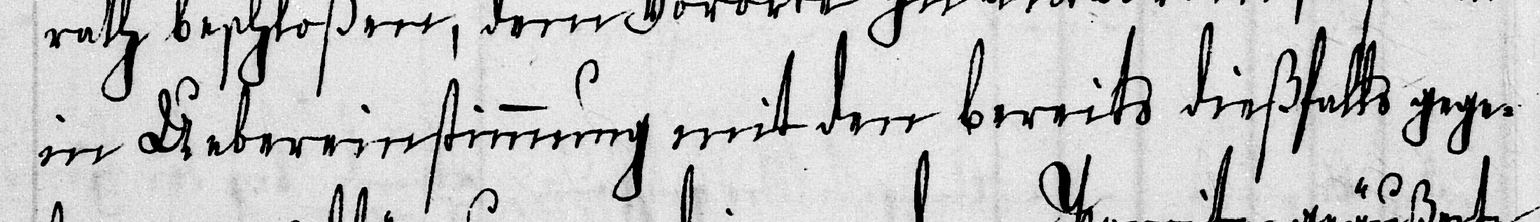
in Uebereinstimmung mit den bereits dießfalls gege¬
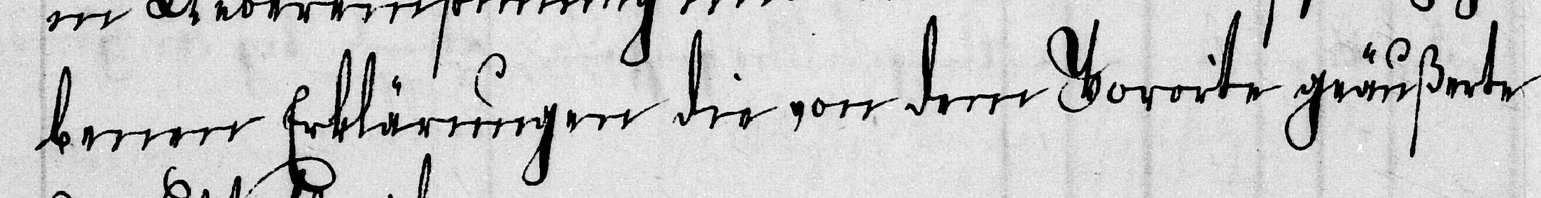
benen Erklärungen die von dem Vororte geäußerte
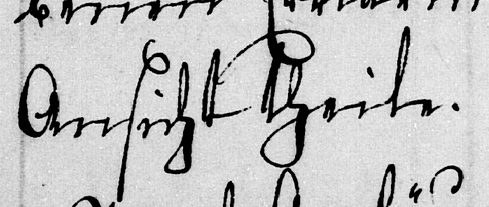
Ansicht theile.
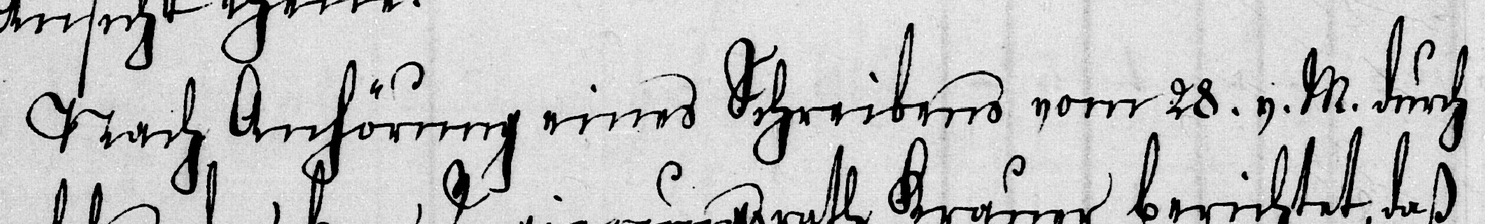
Nach Anhörung eines Schreibens vom 28. v. M. durch
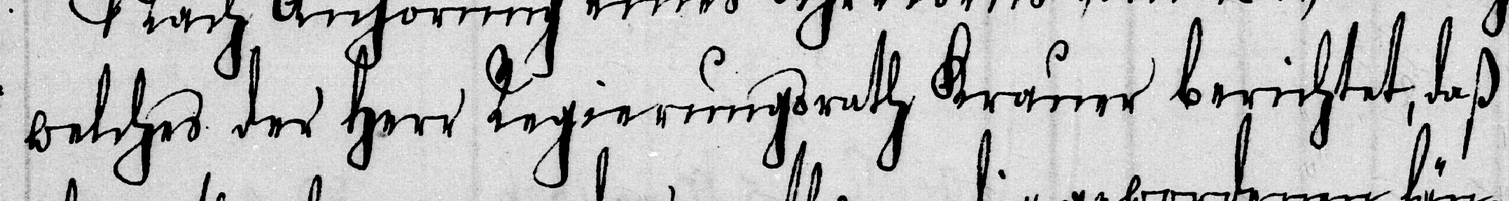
welches der Herr Regierungsrath Krauer berichtet, daß
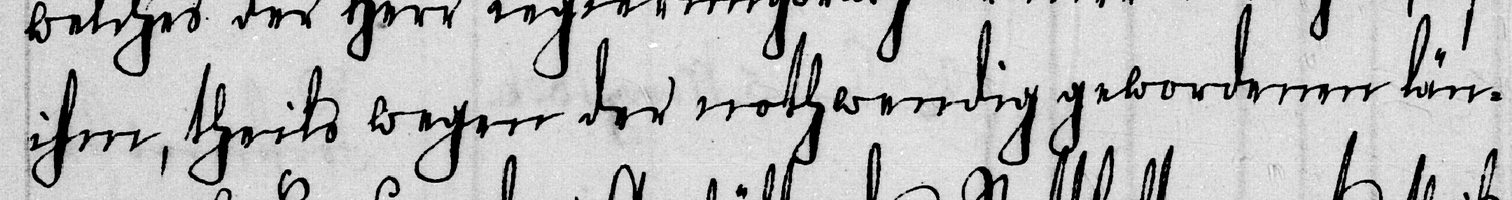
ihm, theils wegen der nothwendig gewordenen län¬
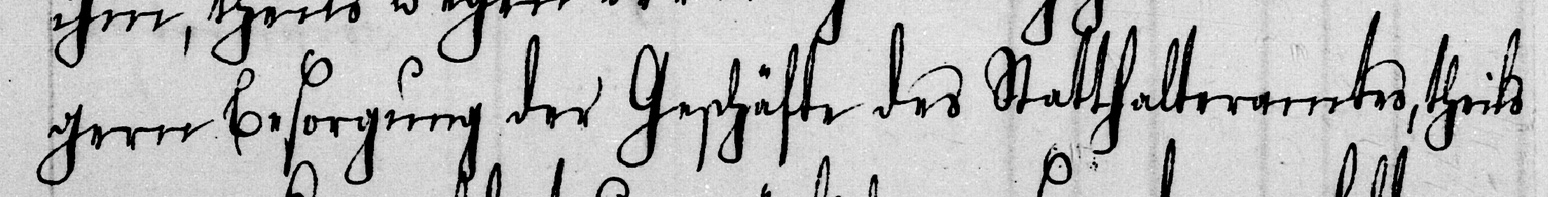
gern Besorgung der Geschäfte des Statthalteramtes, theils
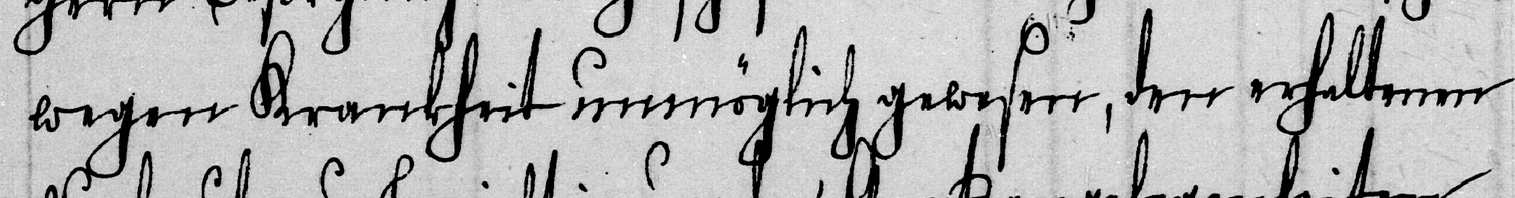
wegen Krankheit unmöglich gewesen, den erhaltenen
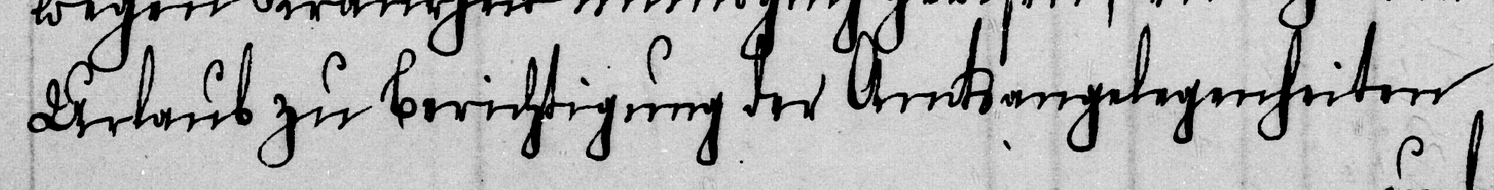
Urlaub zu Berichtigung der Amtsangelegenheiten
